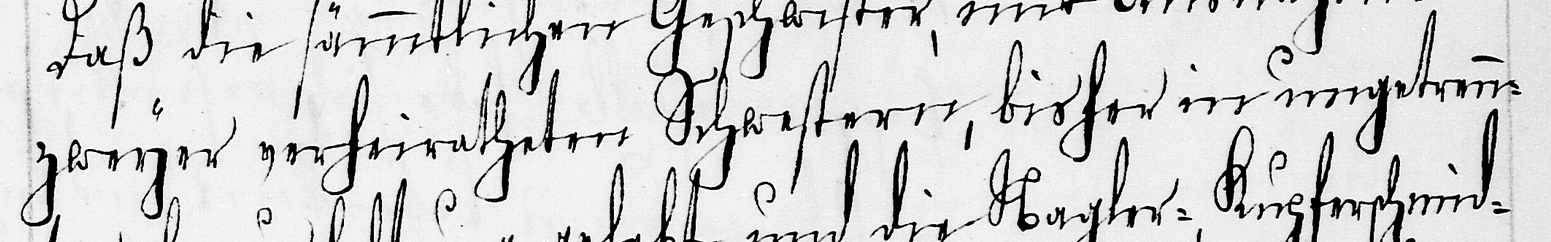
zweyer verheiratheten Schwestern, bisher in ungetrenn¬
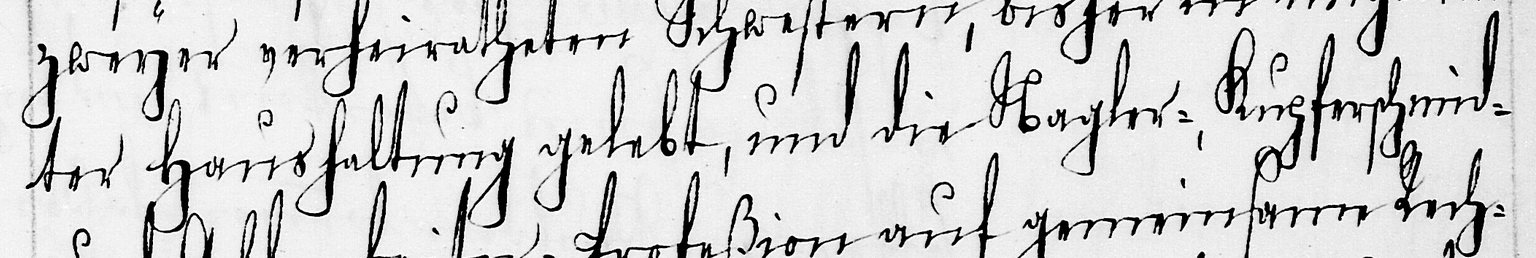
ter Haushaltung gelebt, und die Nagler-, Kupferschmid-
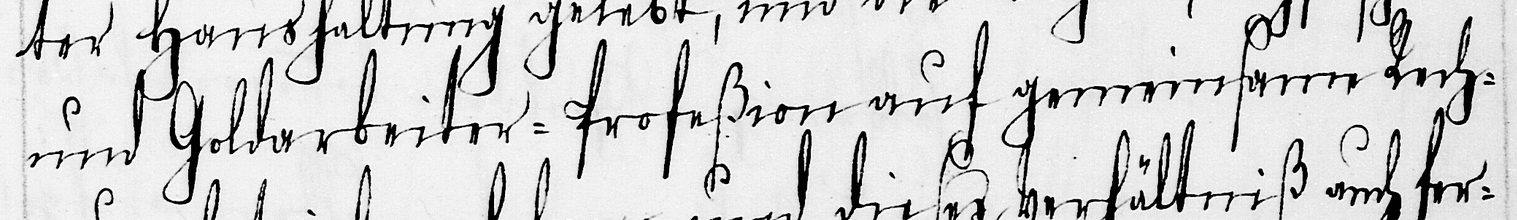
und Goldarbeiter-Profeßion auf gemeinsame Rech¬
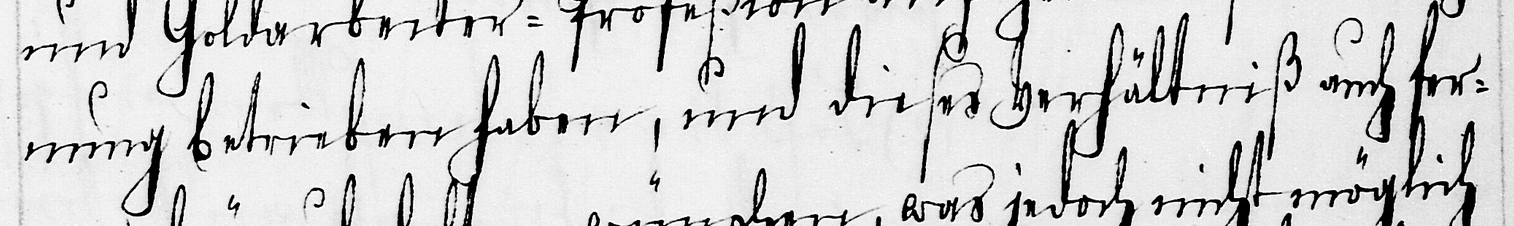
nung betrieben haben, und dieses Verhältniß auch fer¬
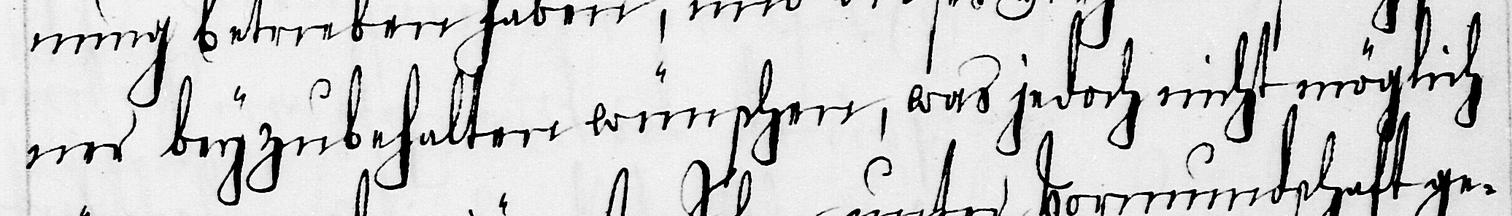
ner beyzubehalten wünschen, was jedoch nicht möglich
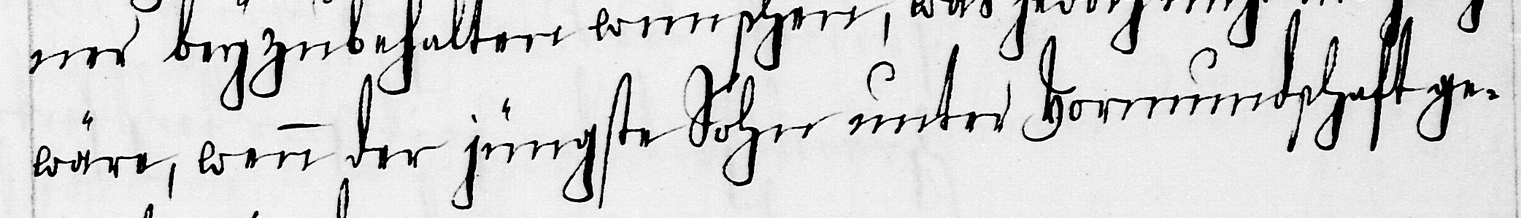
wäre, wenn der jüngste Sohn unter Vormundschaft ge¬
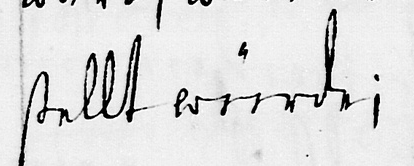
stellt würde;
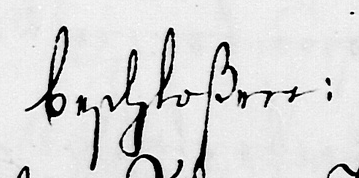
beschloßen:
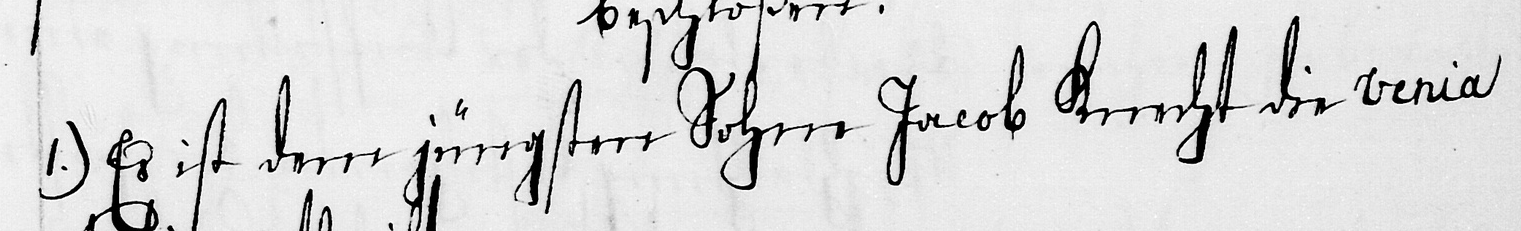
1.) Es ist dem jüngsten Sohne Jacob Knecht die venia
